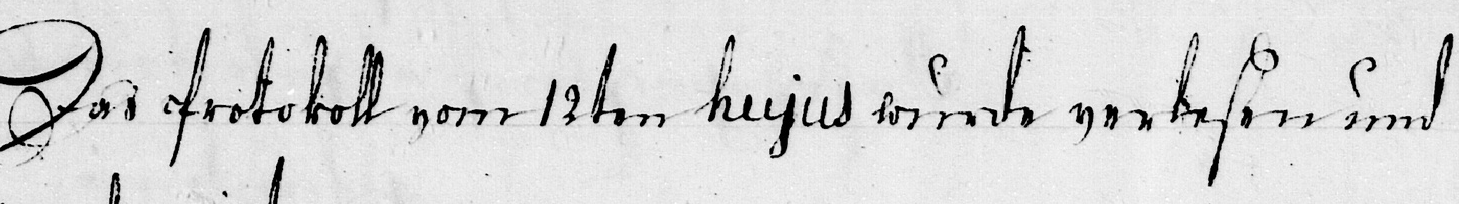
Das Protokoll vom 12ten hujus wurde verlesen und
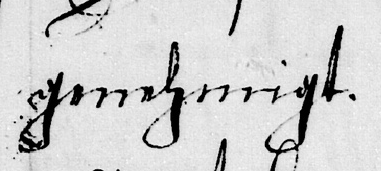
genehmigt.
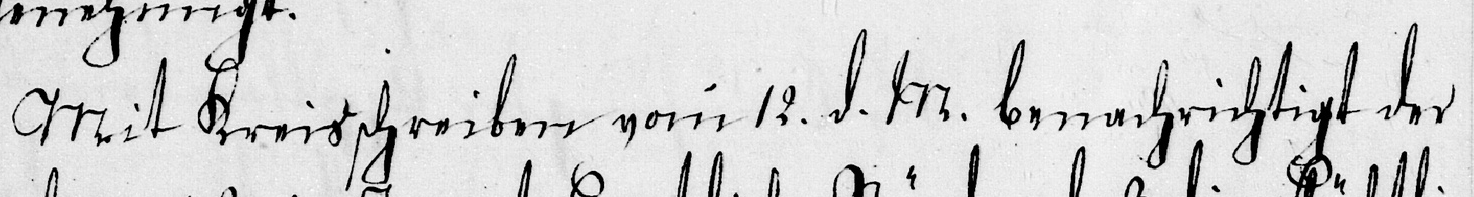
Mit Kreisschreiben vom 12. d. M. benachrichtigt der
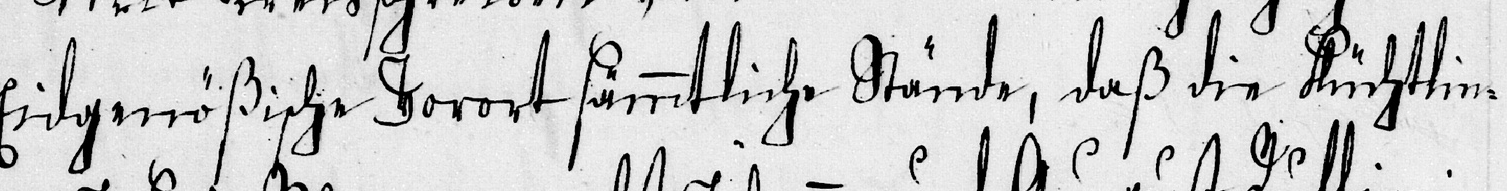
Eidgenößische Vorort sämmtliche Stände, daß die Flüchtlin¬
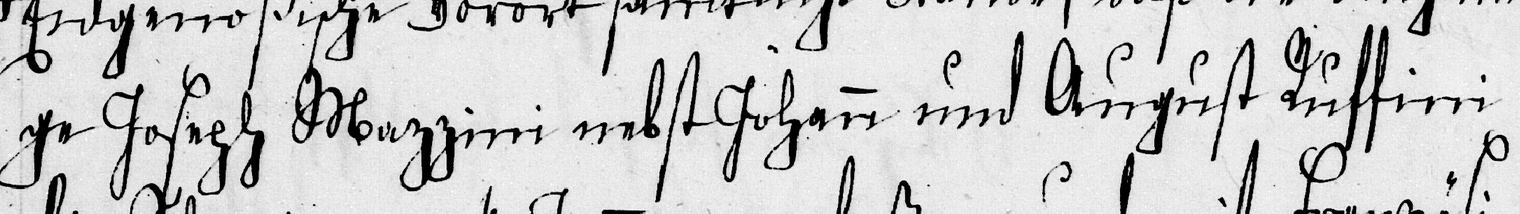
ge Joseph Mazzini nebst Johann und August Ruffini
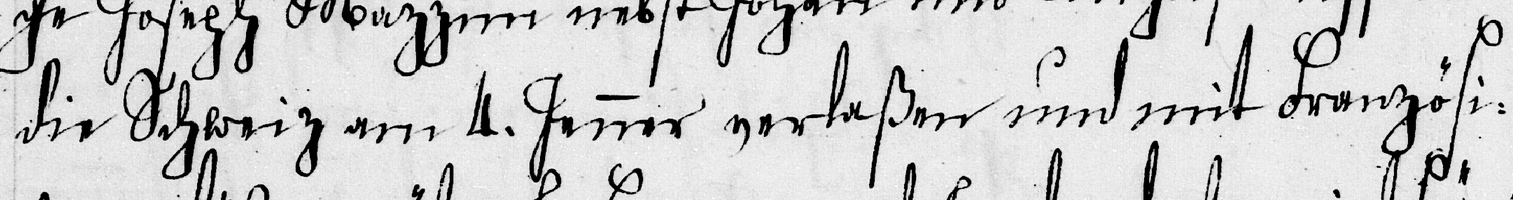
die Schweiz am 4. Januar verlaßen und mit Französi¬
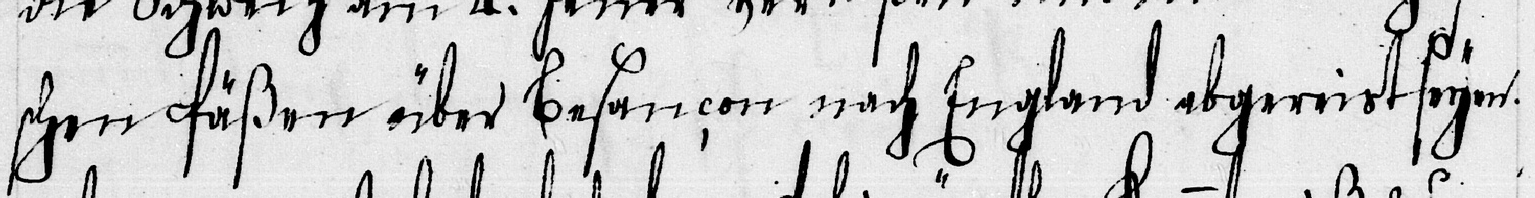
schen Päßen über Besançon nach England abgereist seyen.
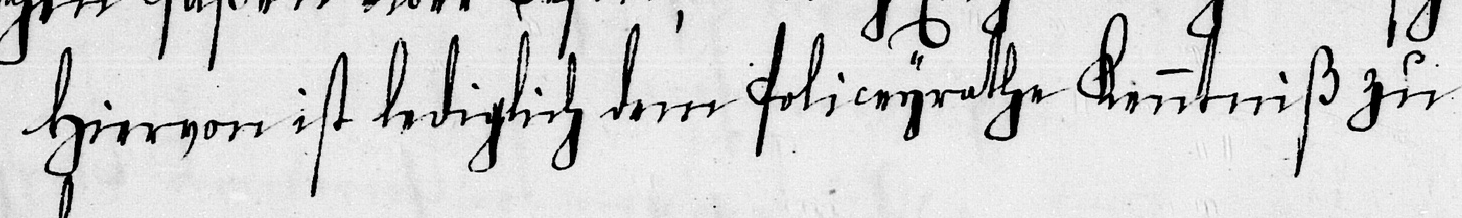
Hiervon ist lediglich dem Policeyrathe Kenntniß zu
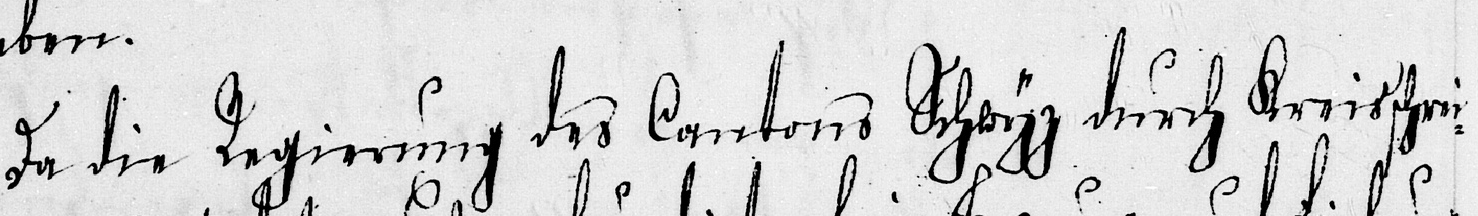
Da die Regierung des Cantons Schwyz durch Kreissch¬
